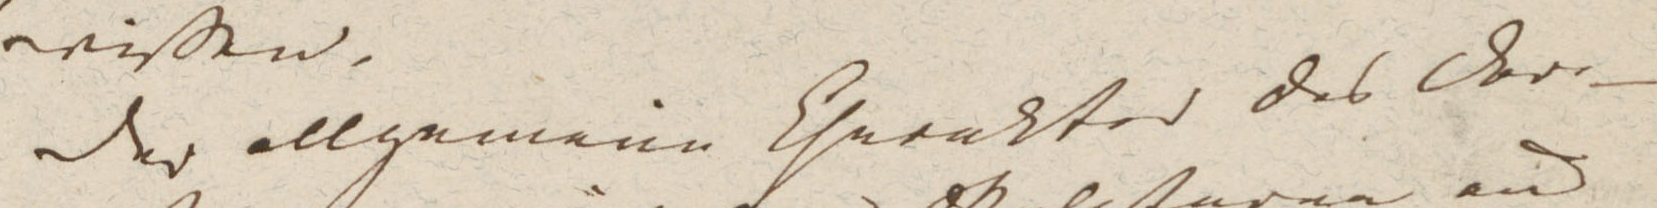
Der allgemeine Charakter des Dar-
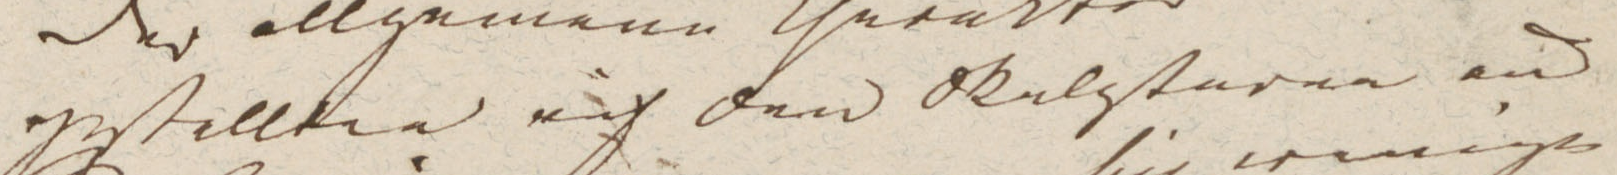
gestellten auf den Skulpturen und
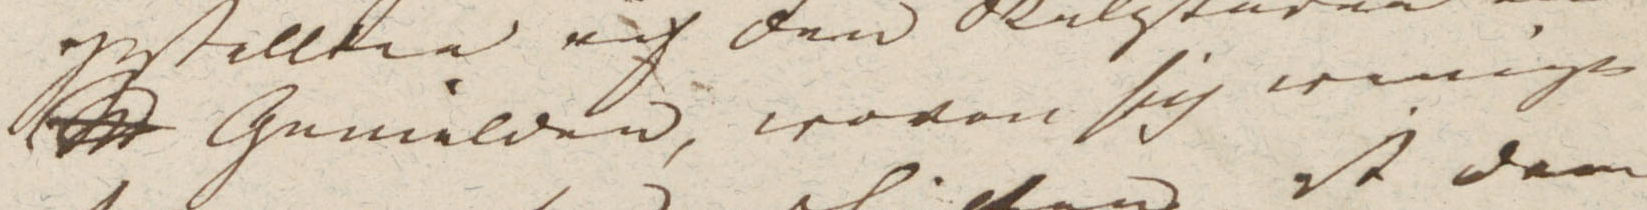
MS Gemälden, wovon sich wenige
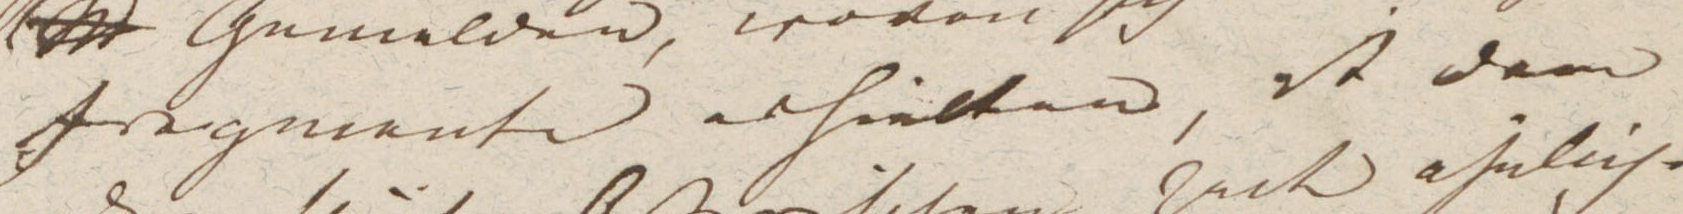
Fragmente erhielten, ist dem
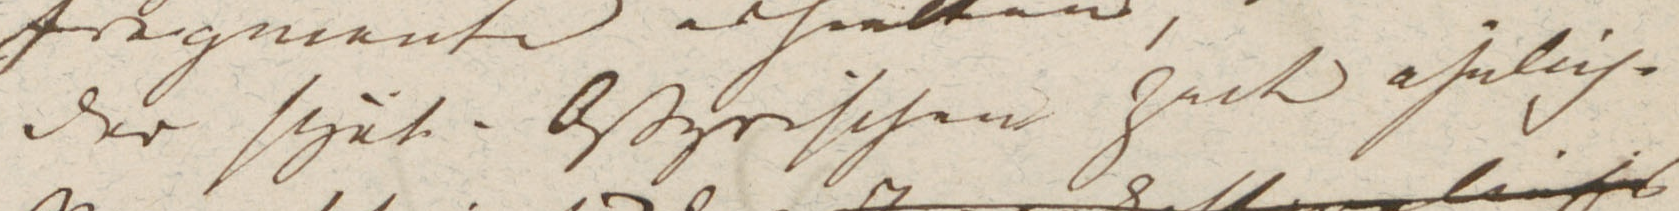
der spät-Assyrischen Zeit ähnlich.
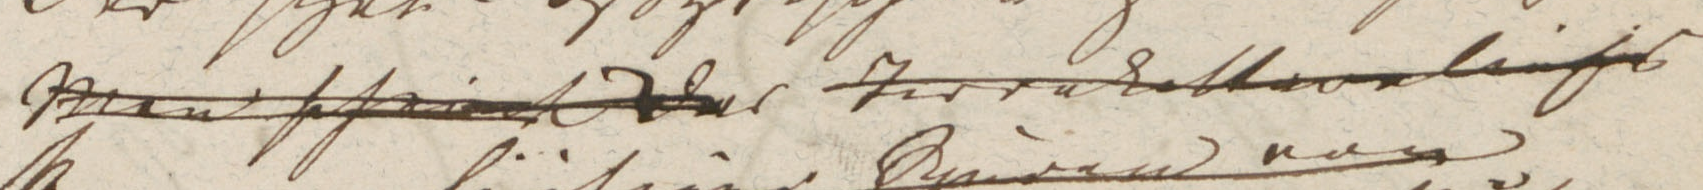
Man scheint dDas Terrakottareliefs
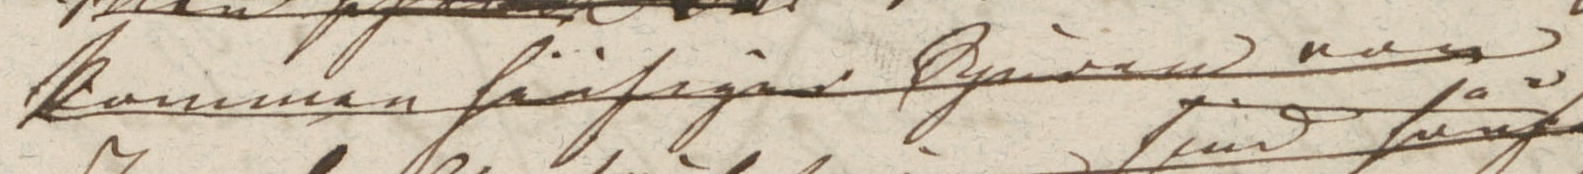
kommen häufiger Spuren von
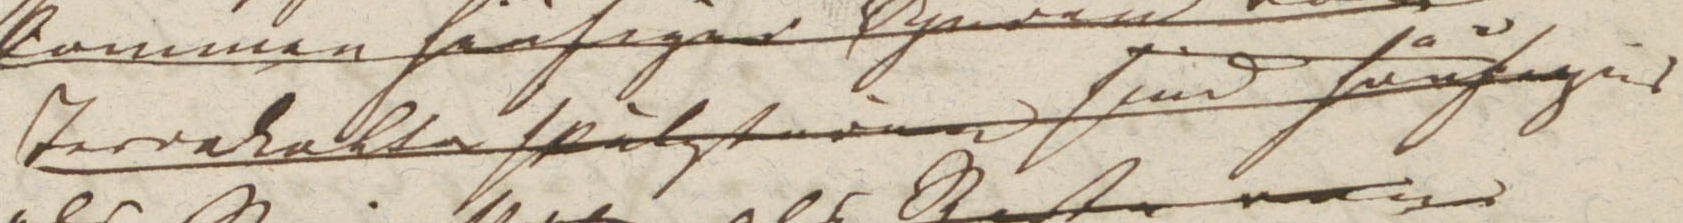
Terrakottaskulpturen sind häufiger
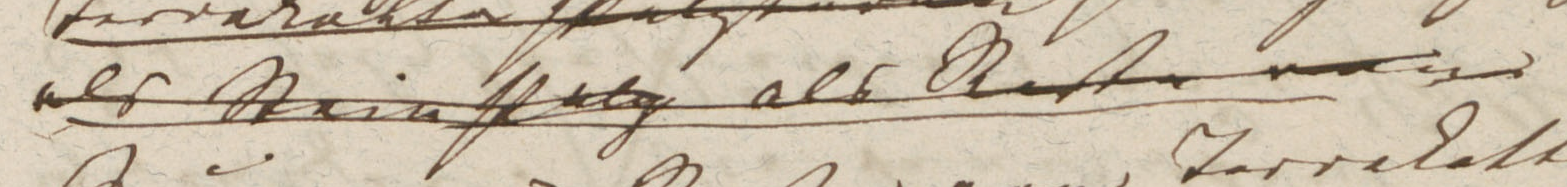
als Steinskulp als Reste von
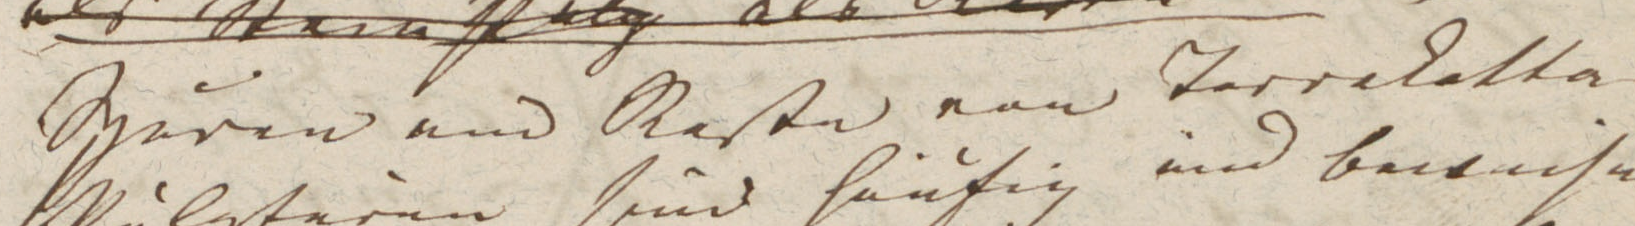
Spuren und Reste von Terrakotta-
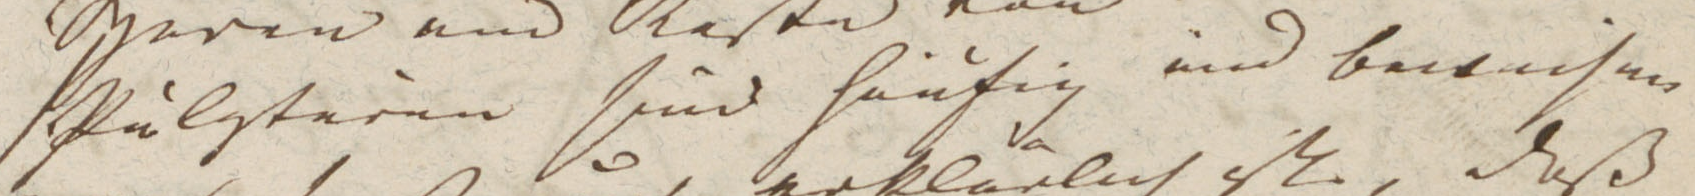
skulpturen sind häufig und beweisen
